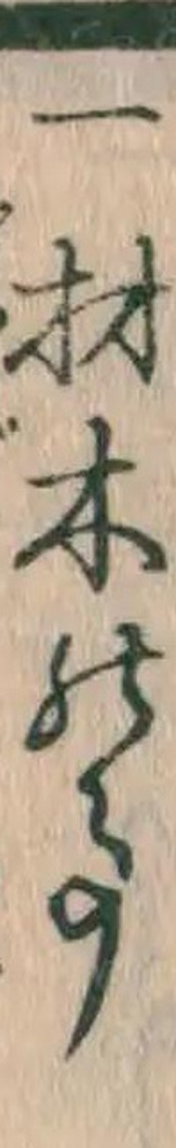一柱の事
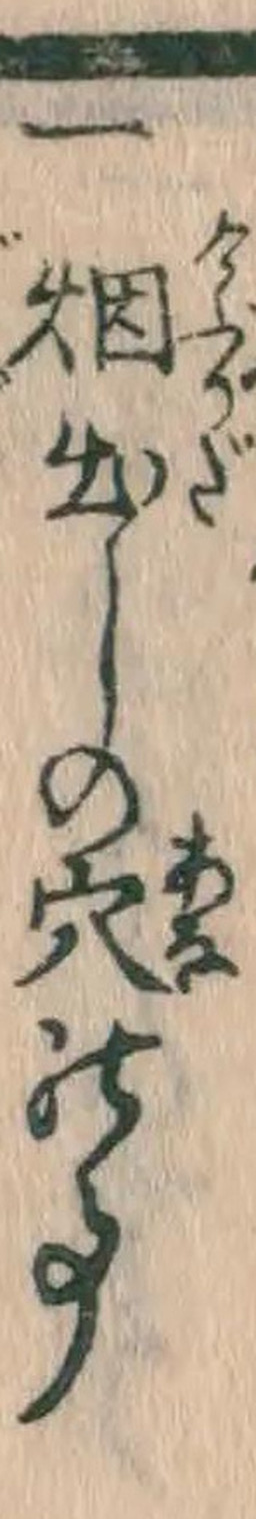一煙出しの穴の事
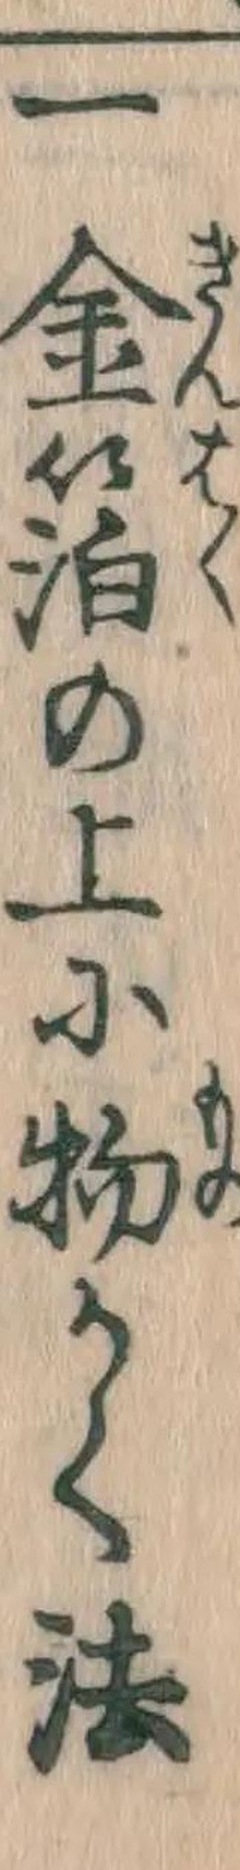一金箔の上に物かく法
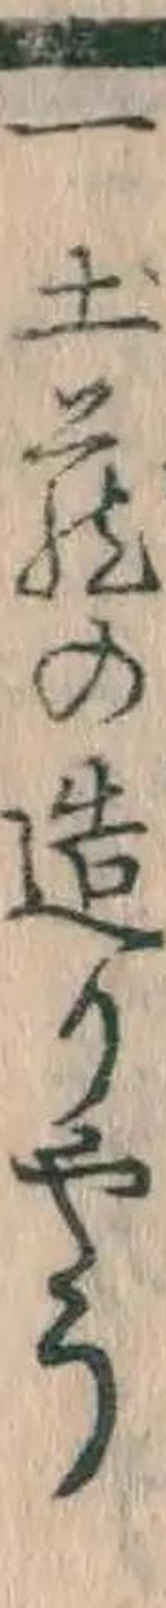一土蔵の造りやう
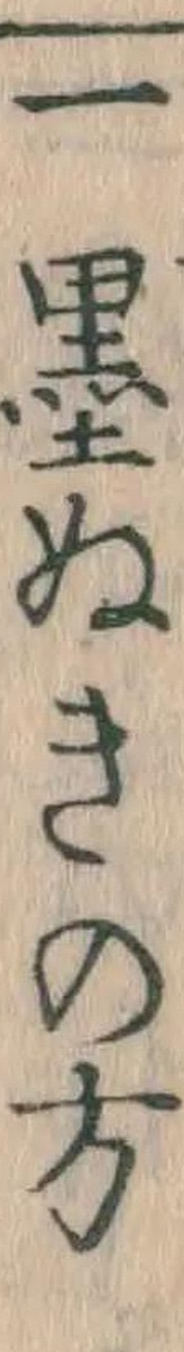一墨ぬきの方
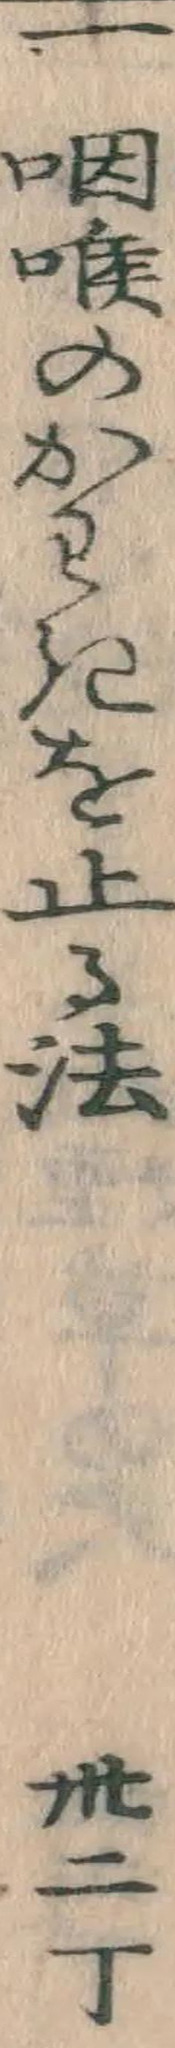一咽唯のかわきを止る法卅二丁
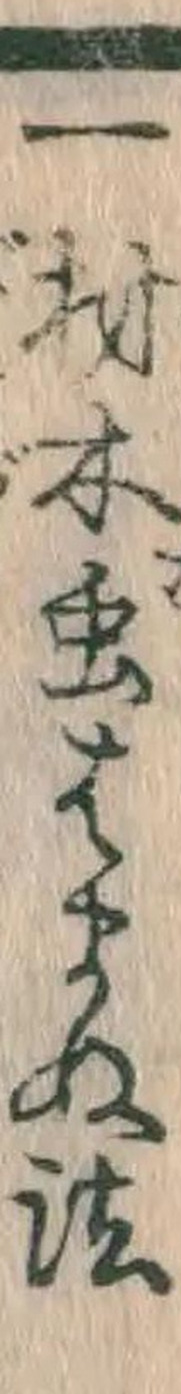一材木虫はまぬ法
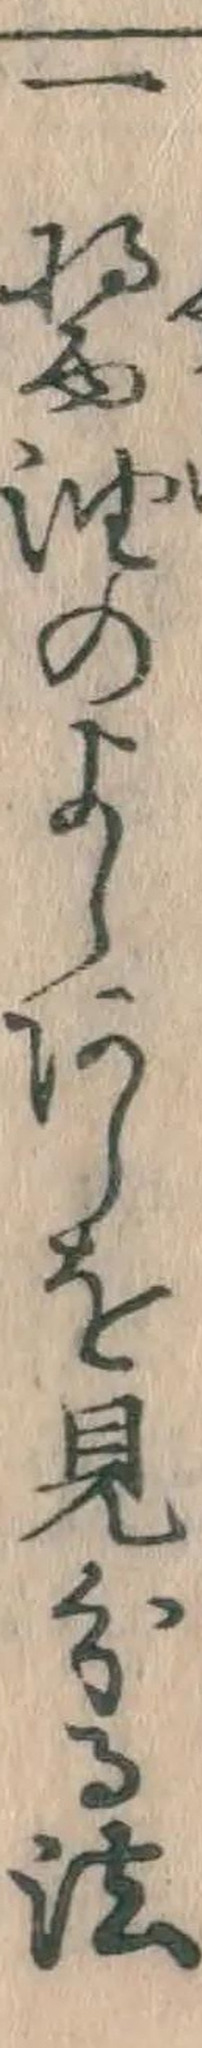一醬油のよしあしを見分る法
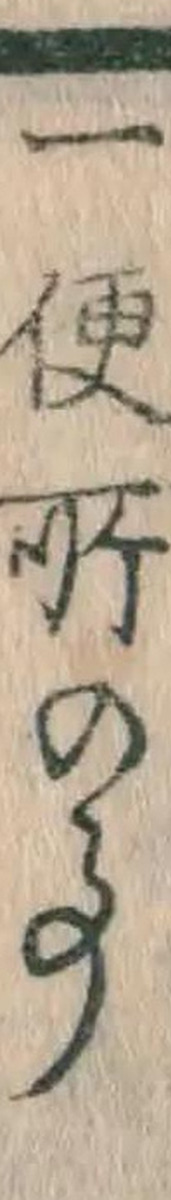一柱の事
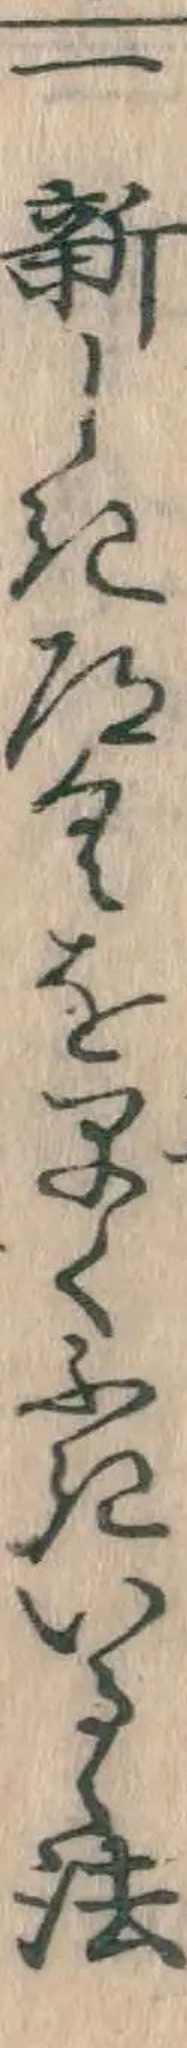一新しき道具を早くふきいるゝ法
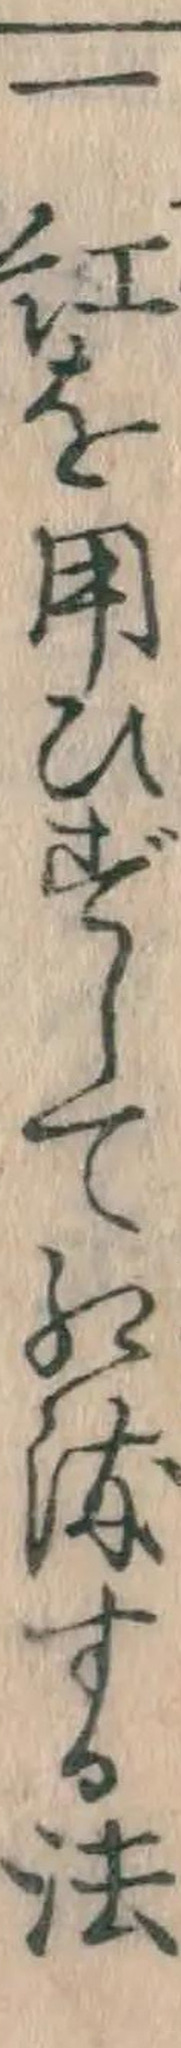一紅を用ひずして紅染する法
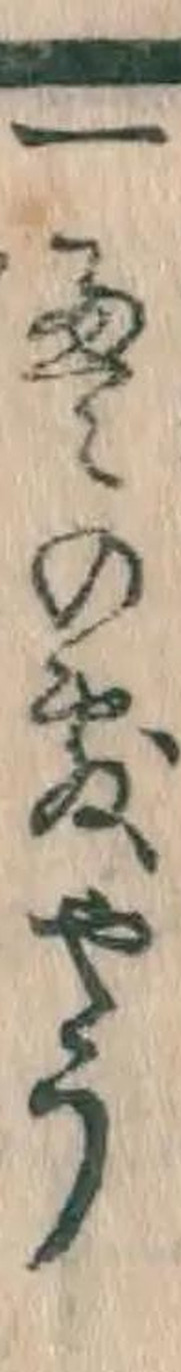一畳の敷やう
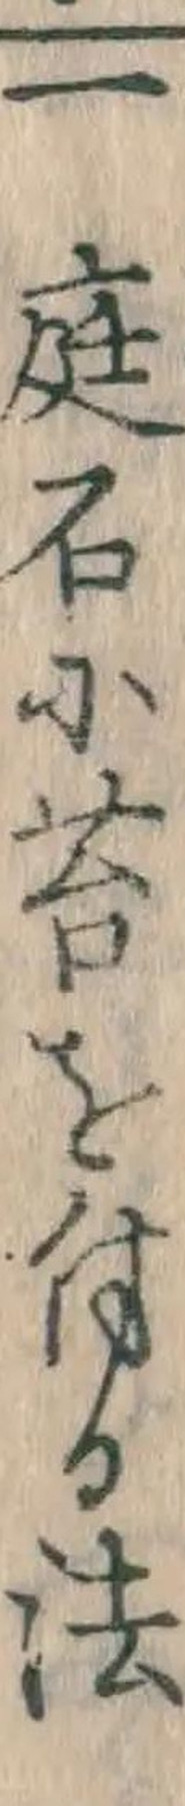一庭石に苔を付る法
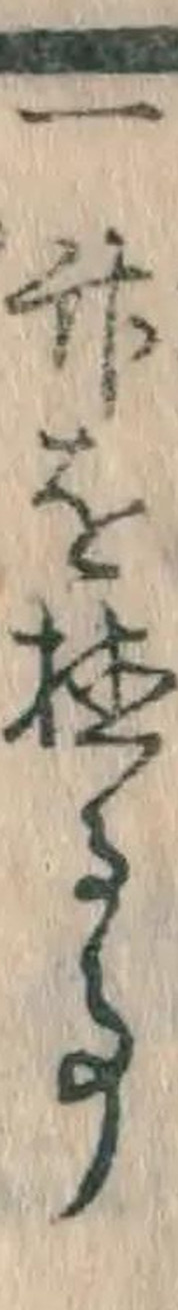一竹を植る事
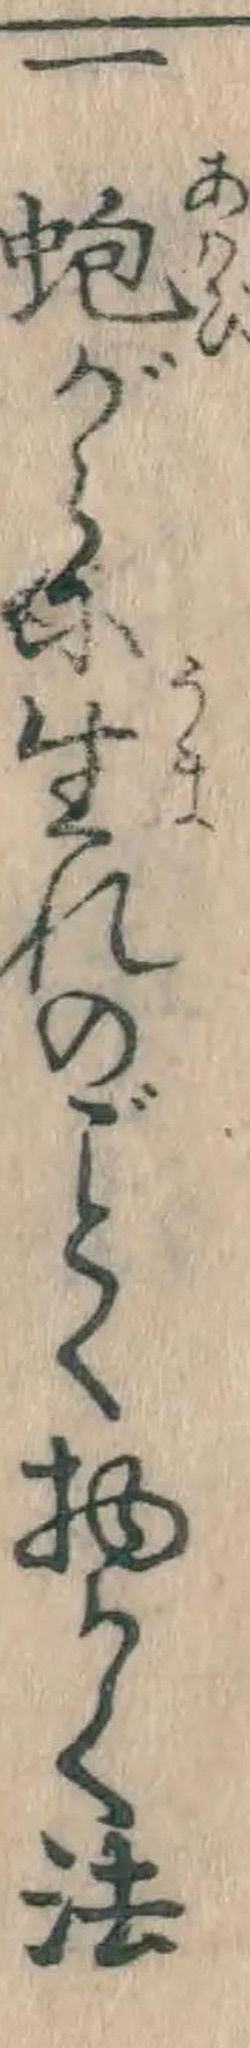一蚫がらに生れのごとく物かく法
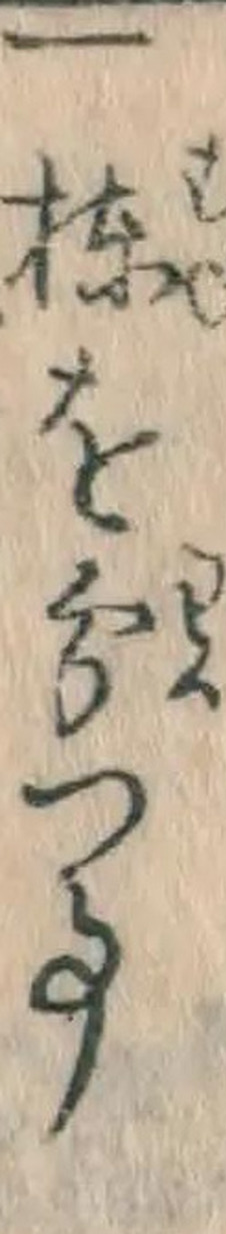一棟を分つ事
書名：広益秘事大全 3巻. [1]
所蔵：国立国会図書館 National Diet Library, JAPAN
